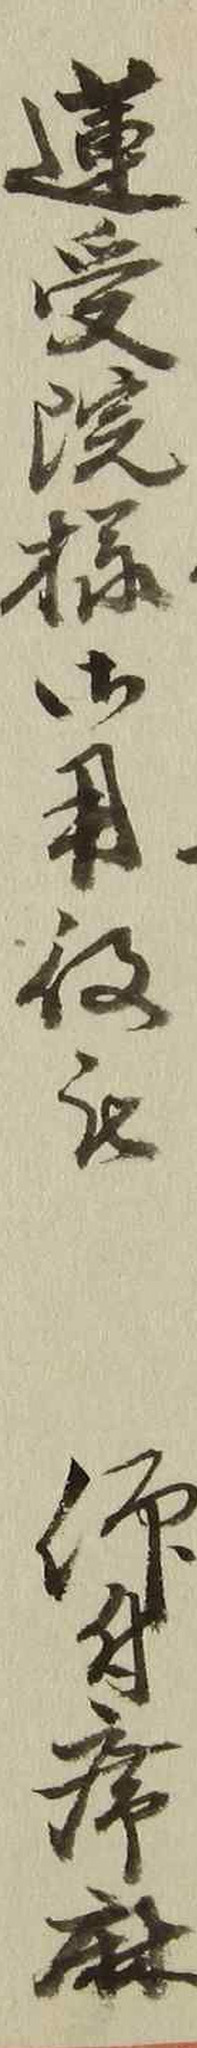蓮受院様御用役被仰付席麻
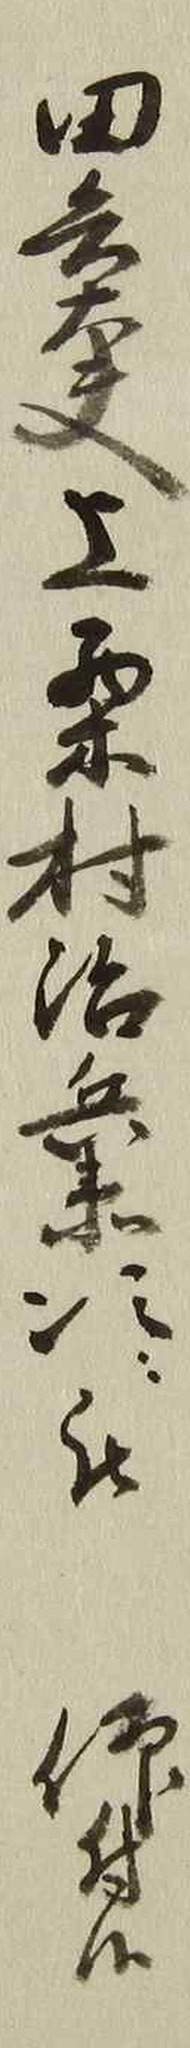田兵大夫上栗村治兵衛次ニ被仰付候
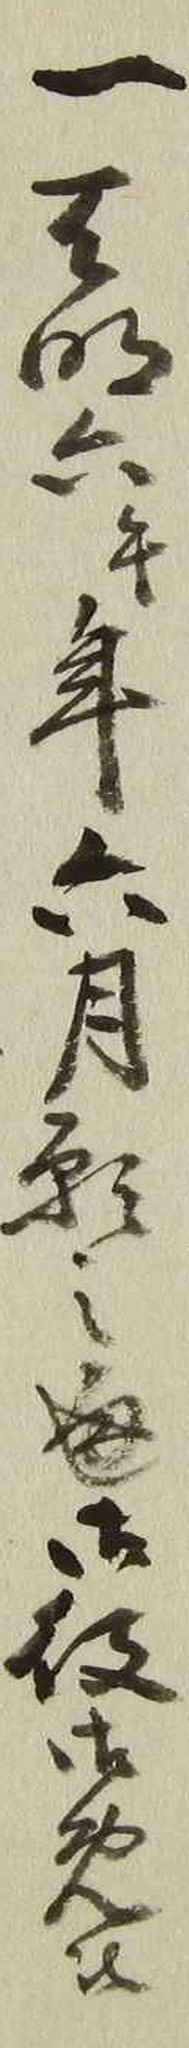一天明六午年六月願之通御役御免被
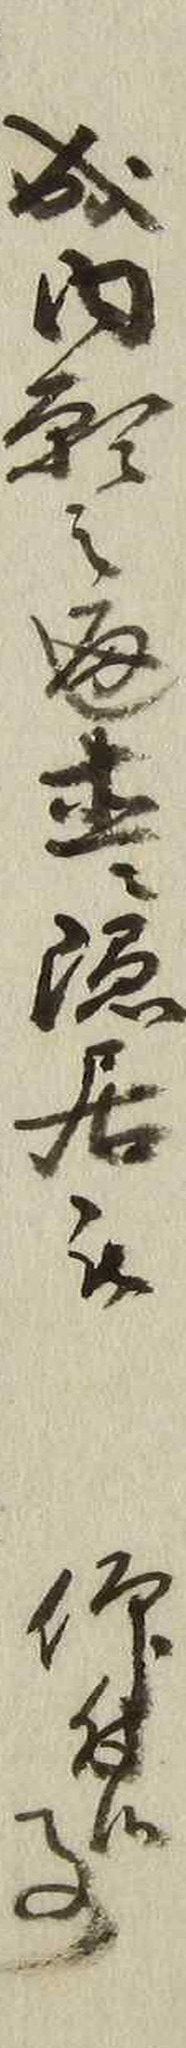成内願之通直ニ隠居被仰付候事
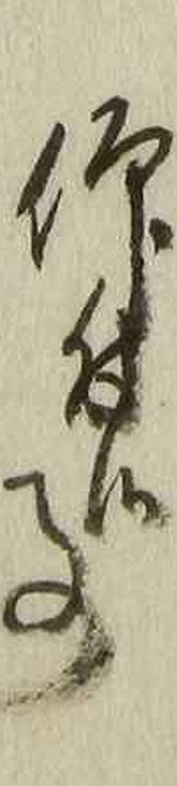仰付候事
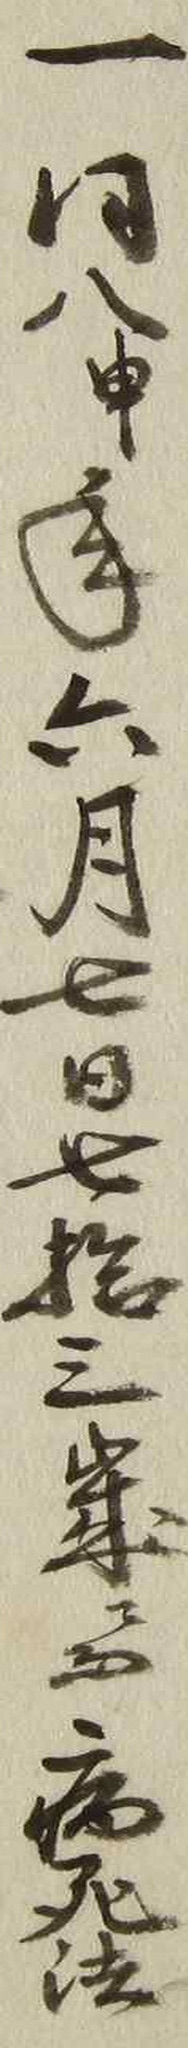一同八申年六月七日七拾三歳ニ而病死法
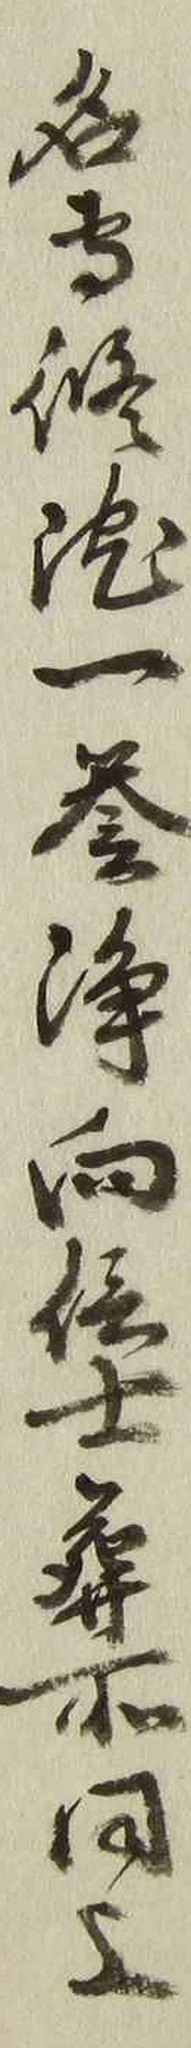名専修院一誉浄向信士葬所同上
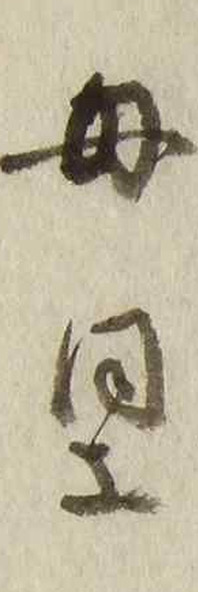母同上

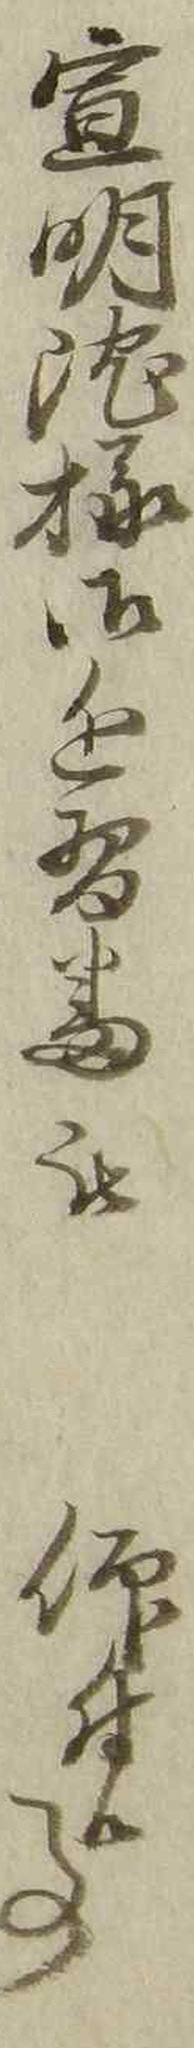宣明院様御近習番被仰付候事
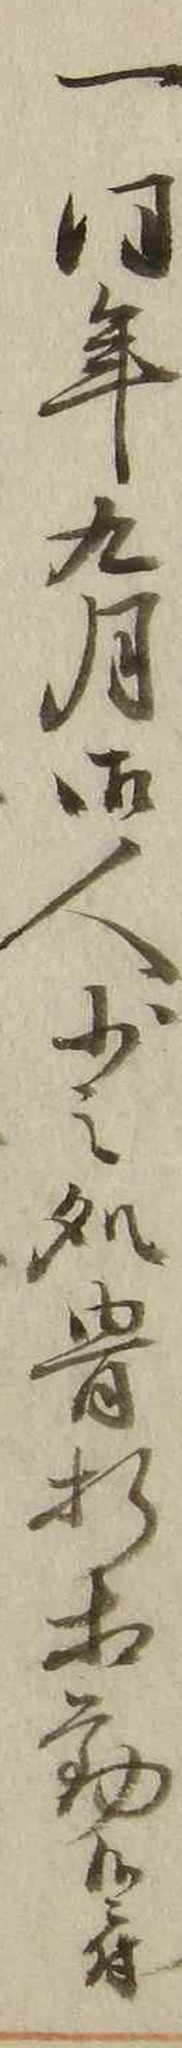一同年九月御人少之処骨折相勤候ニ付
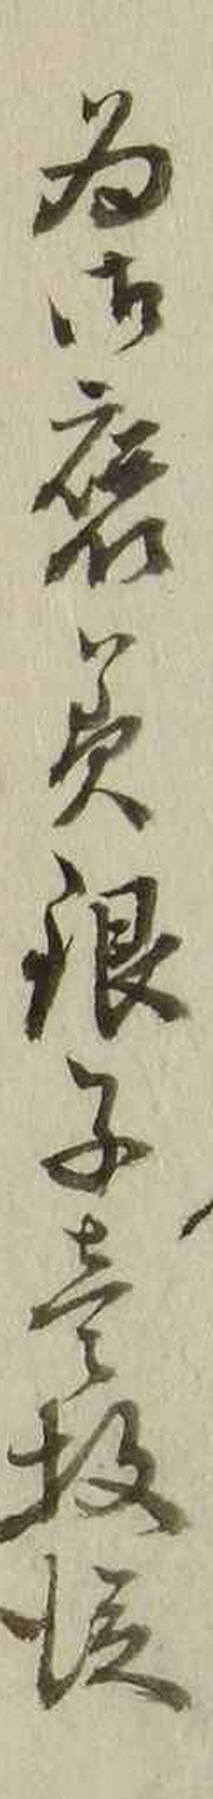為御褒美銀子壱枚従
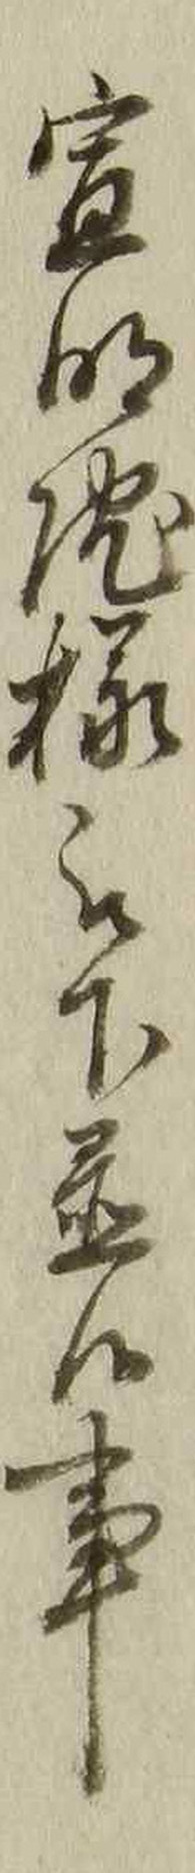宣明院様被下置候事
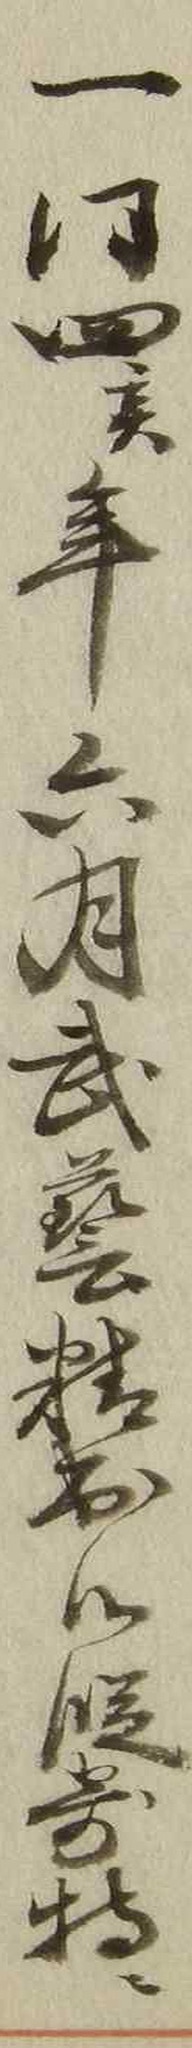一同四亥年六月武芸精出候段奇特ニ
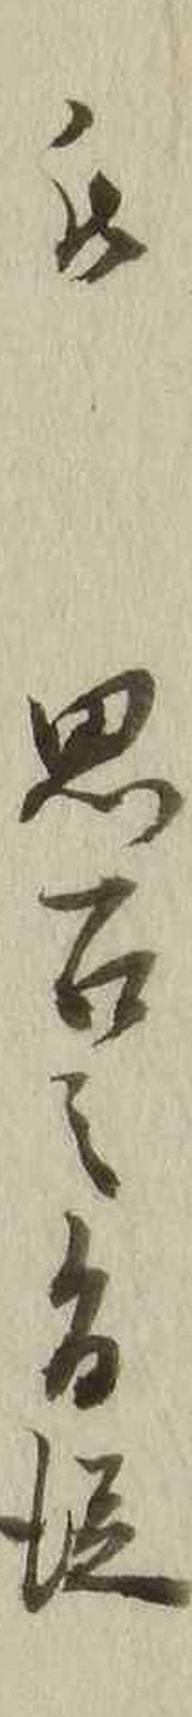被思召之旨従
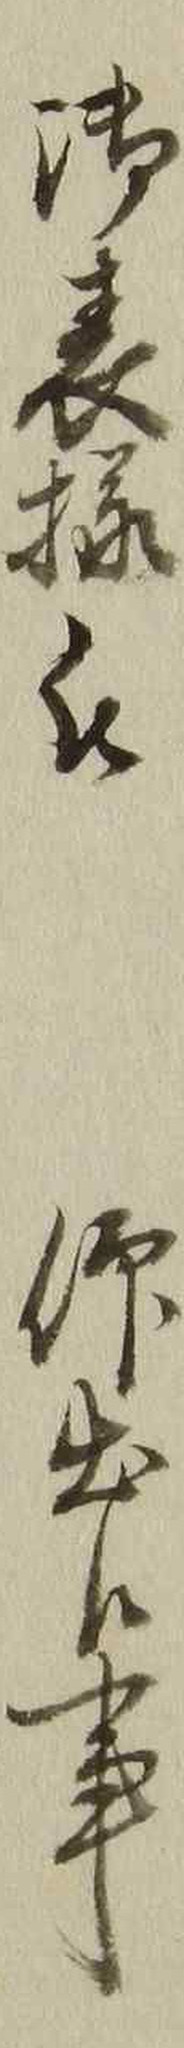御表様被仰出候事
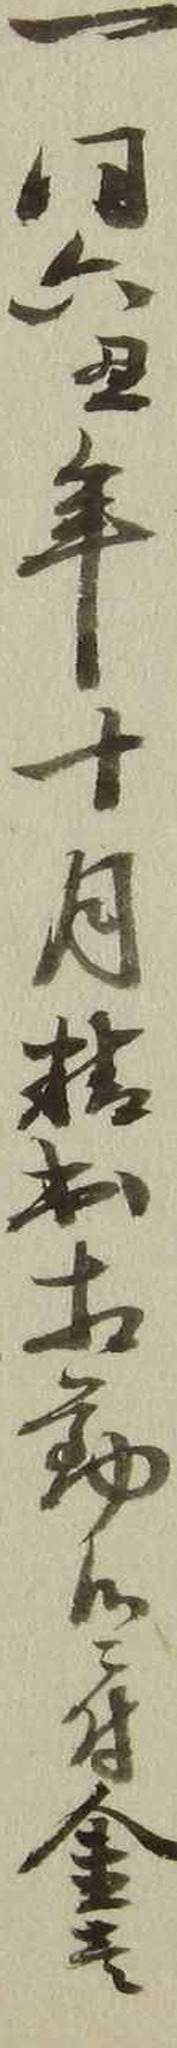一同六丑年十月精出相勤候ニ付金壱
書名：諸士系譜　巻之53　に之部4
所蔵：会津若松市立会津図書館
